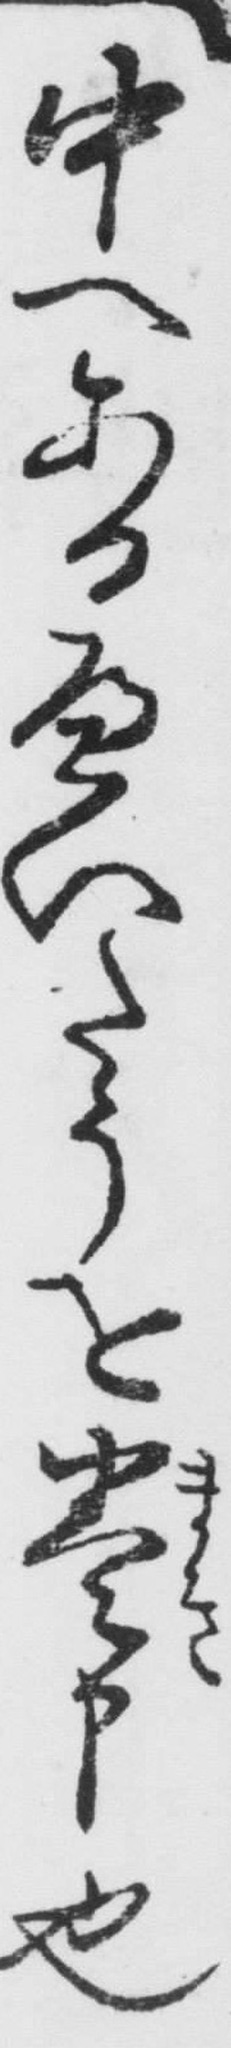中へあるへいたうを巻申也
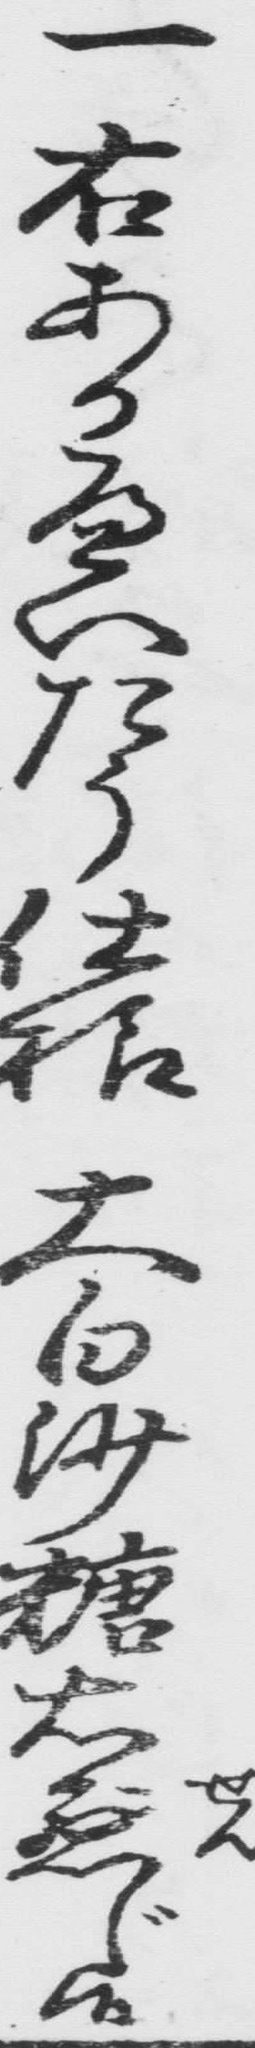一右あるへいたう仕様大白沙糖右煎じ候
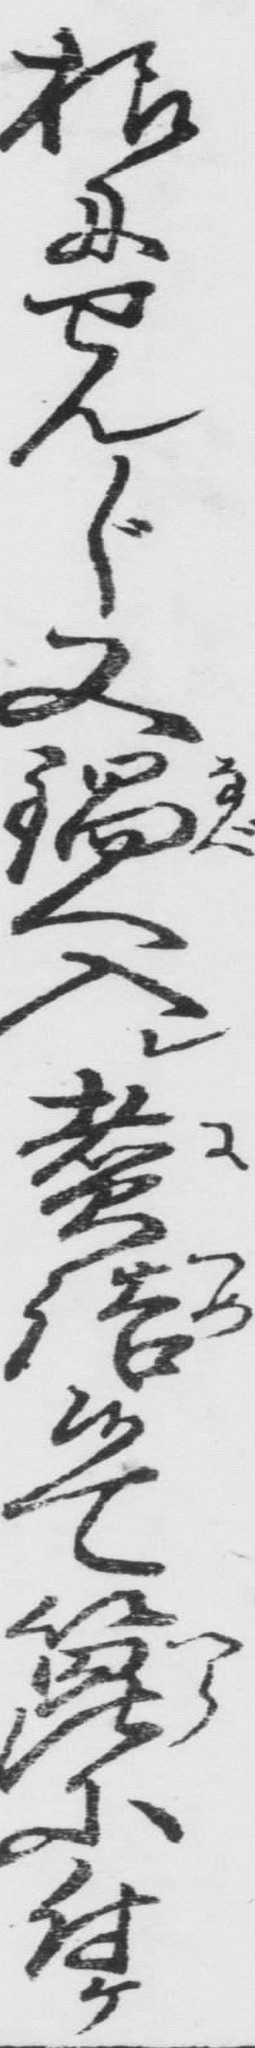様にせんじ又鍋へ入れ煮詰候て箆に付け
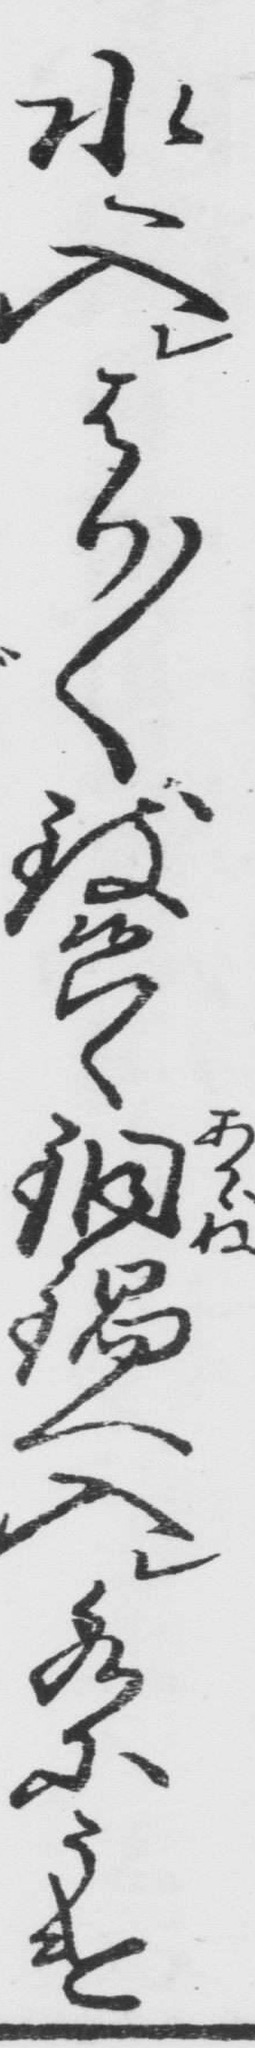水へ入れはり〳〵致候はゝ銅鍋へ入れ水にうけ
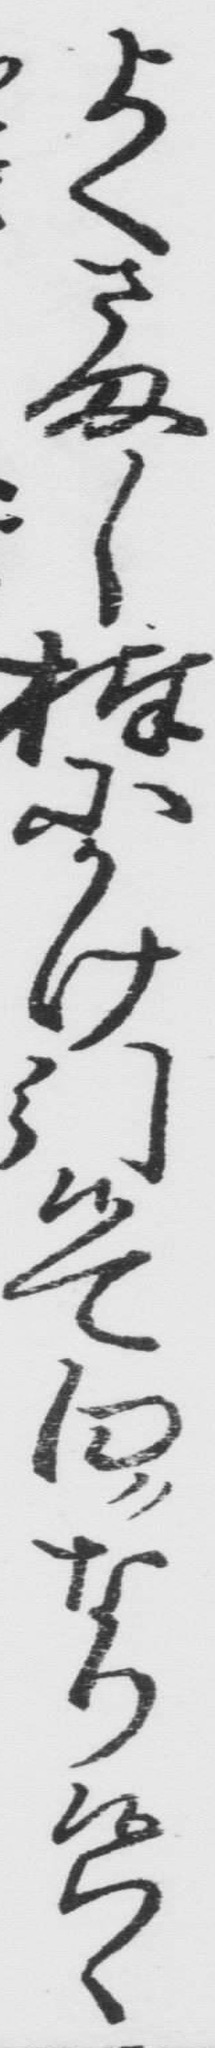よくさまし棒にかけ引候て白くなり候はゝ
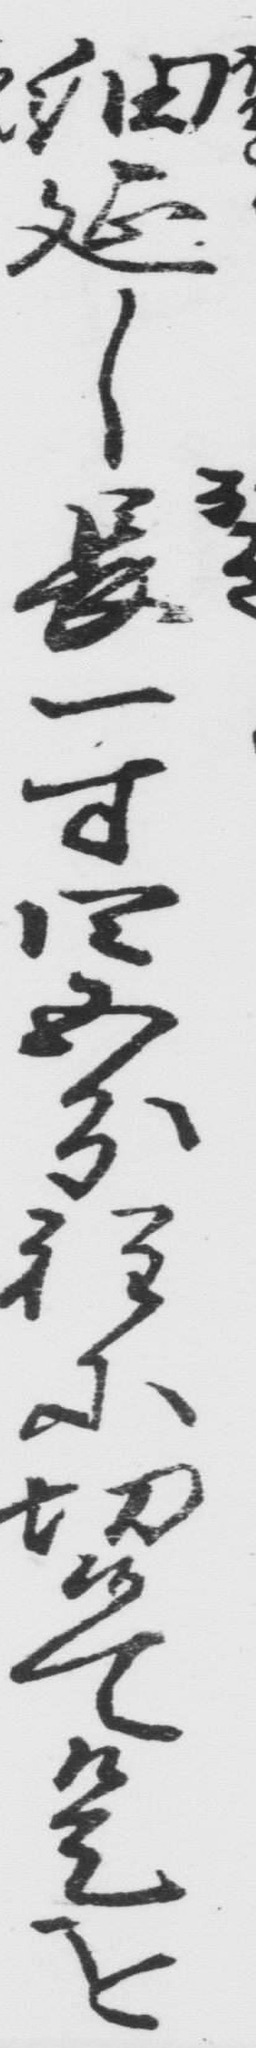細延し長一寸四五分程に切候て是を
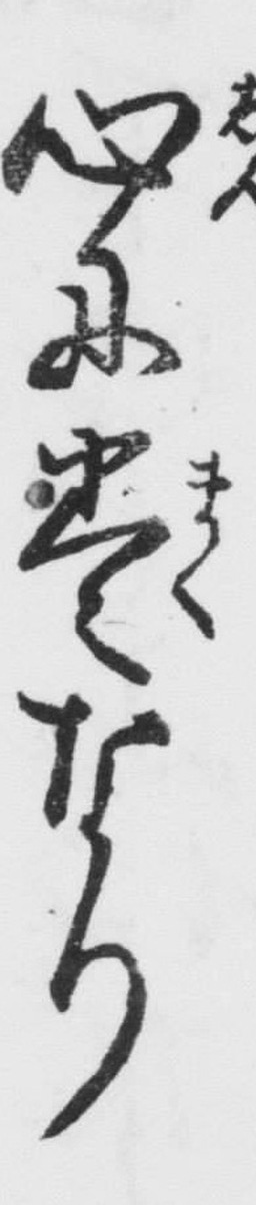心に巻なり
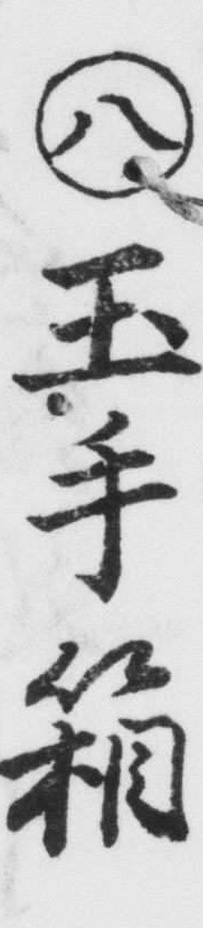(八)玉手箱
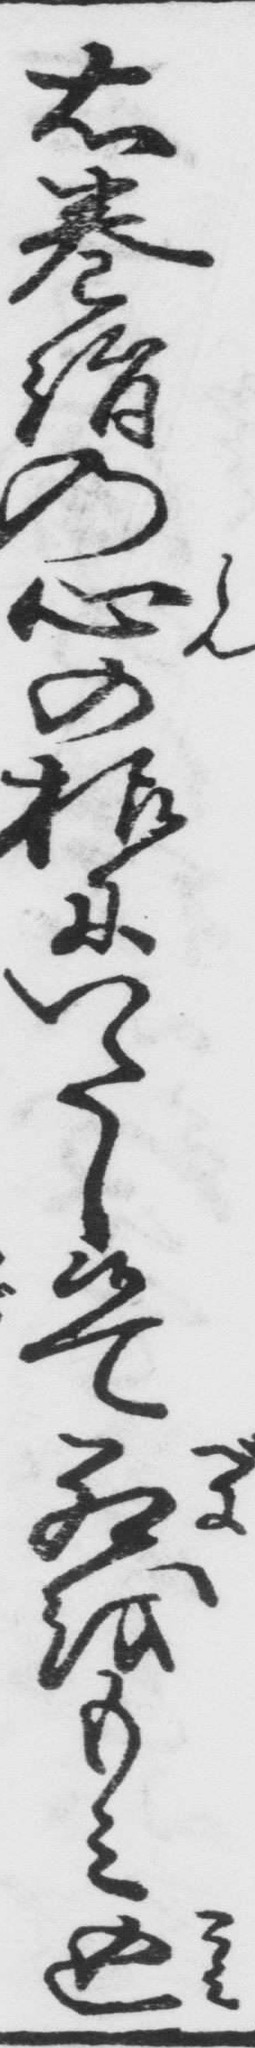右巻絹の心の様にいたし候て紅をもみ込
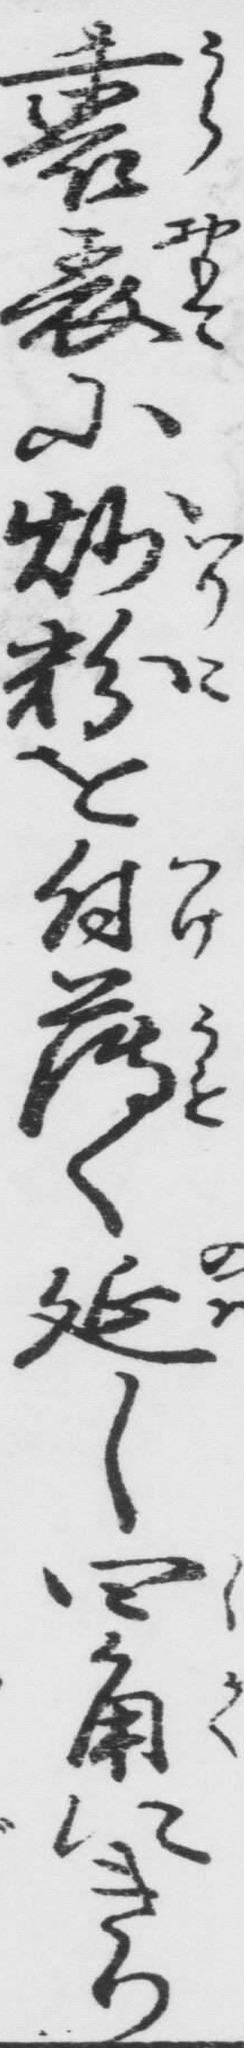裏表に炒粉を付薄く延し四角にきり
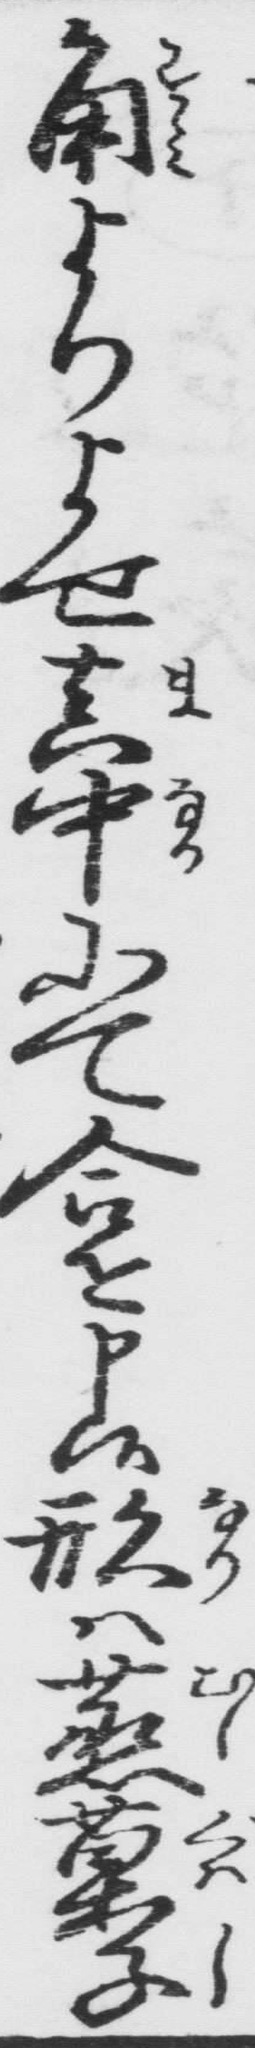角よりよせ真中にて合せ申候形は蒸菓子
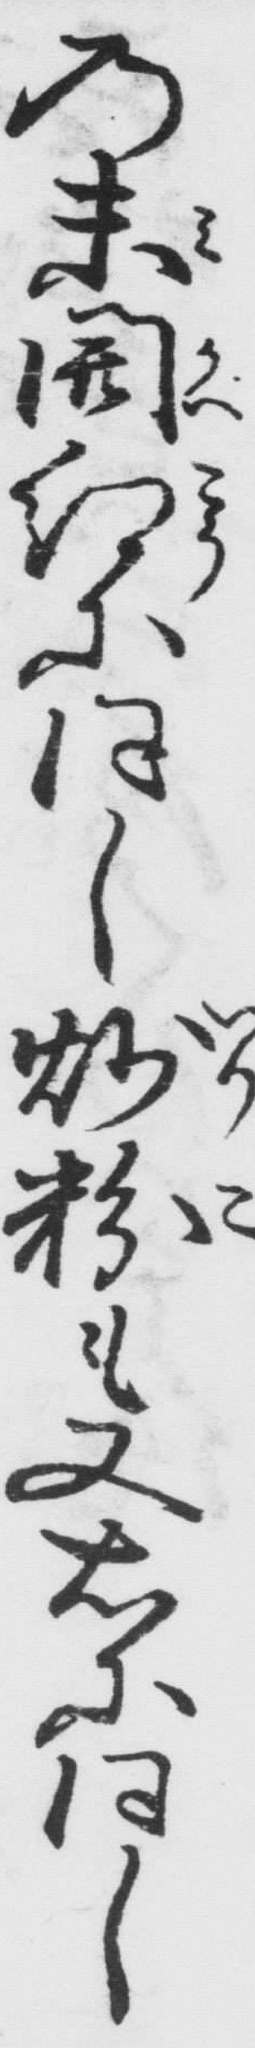の未開紅に同し炒粉も又右に同し
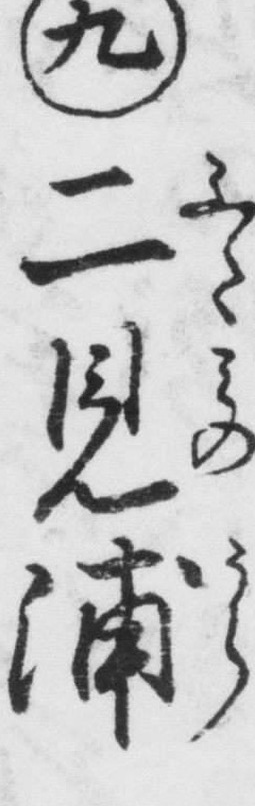(九)二見浦

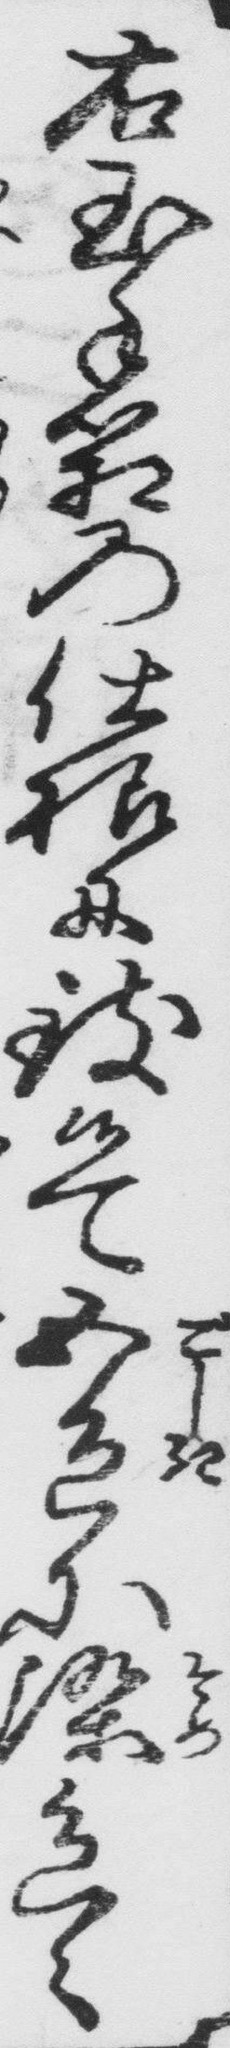右玉手箱の仕様に致候て五色に染色々
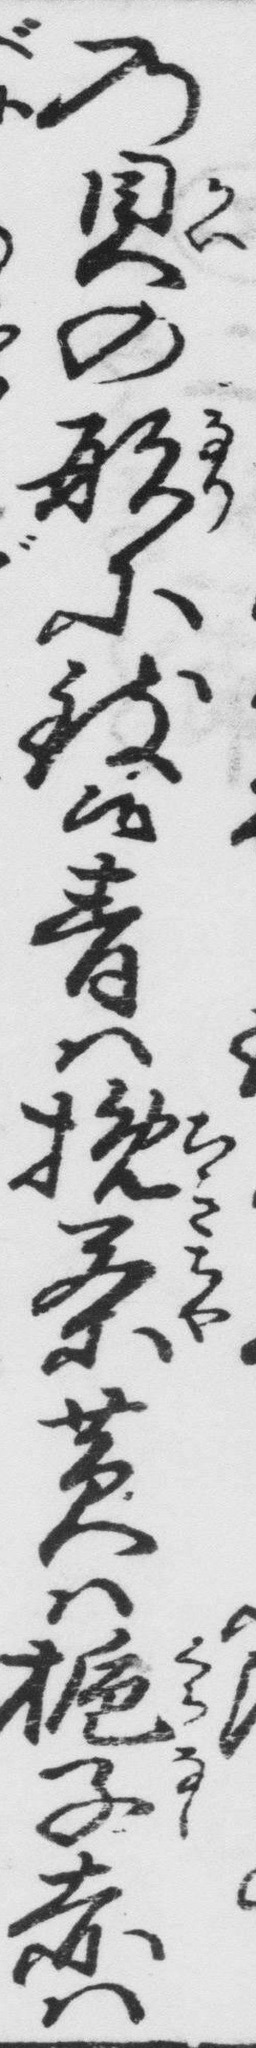の貝の形に致候青は挽茶黄は梔子赤は
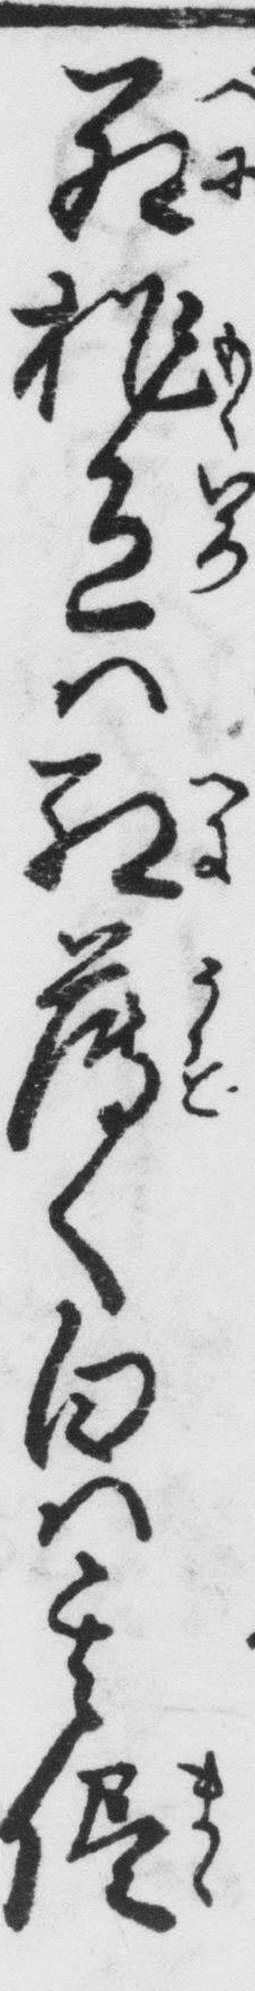紅桃色は紅薄く白は其儘
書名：御前菓子図式
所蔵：大阪府立大学学術情報センター 国文学研究資料館
